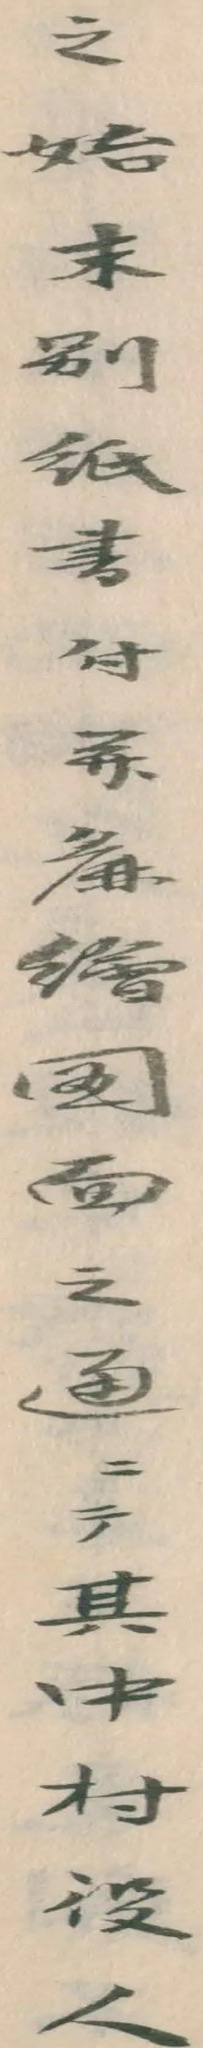之始末別紙書付并麁絵図面之通ニテ其中村役人

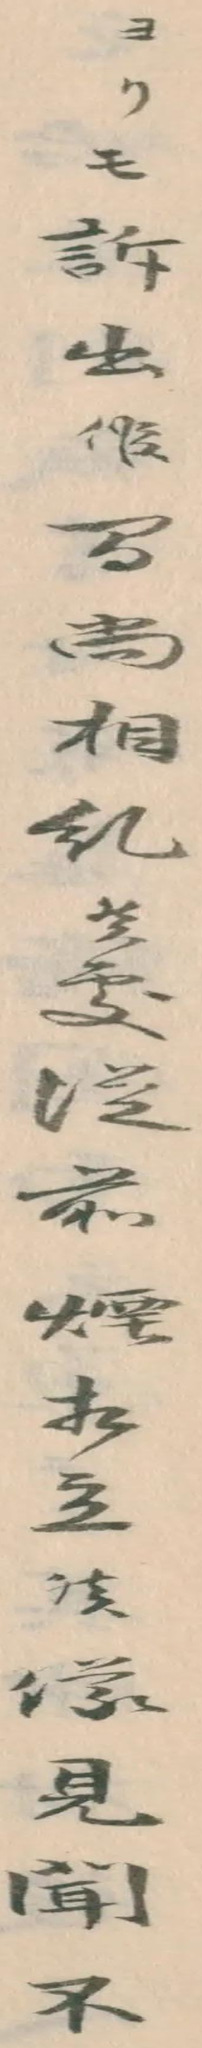ヨリモ訴出候間尚相糺候処従前煙相立候儀見聞不
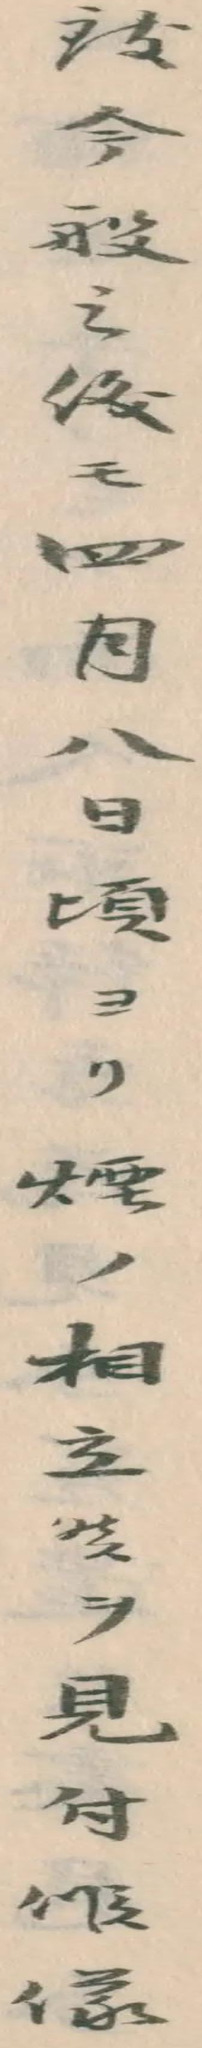致今般之儀モ四月八日頃ヨリ煙ノ相立候ヲ見付候儀
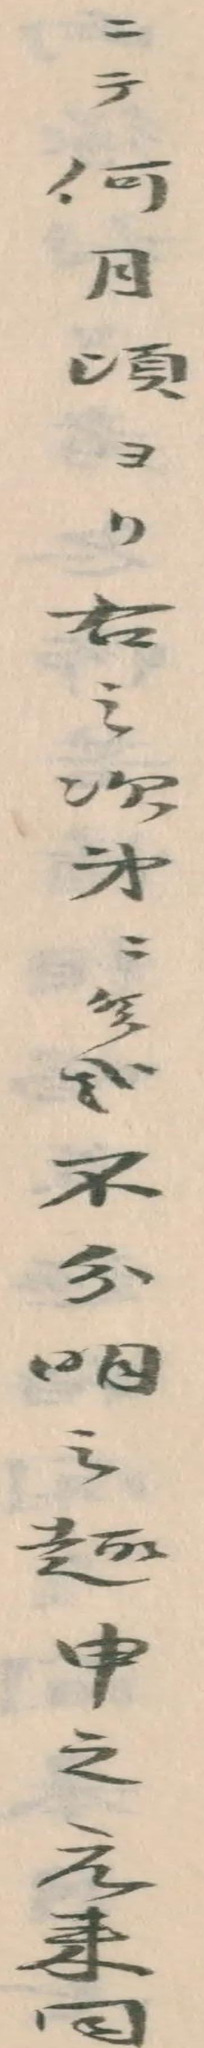ニテ何月頃ヨリ右之次第ニ候哉不分明之趣申之元来同
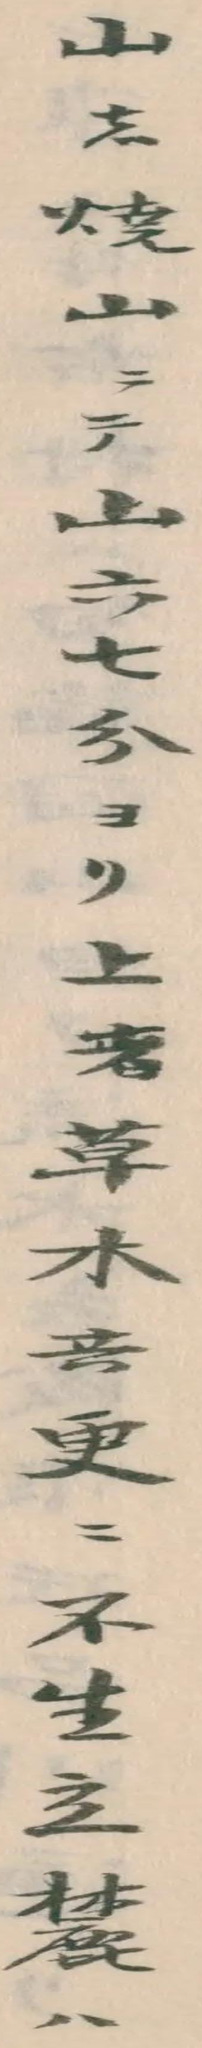山者焼山ニテ山六七分ヨリ上者草木共更ニ不生立麓ハ
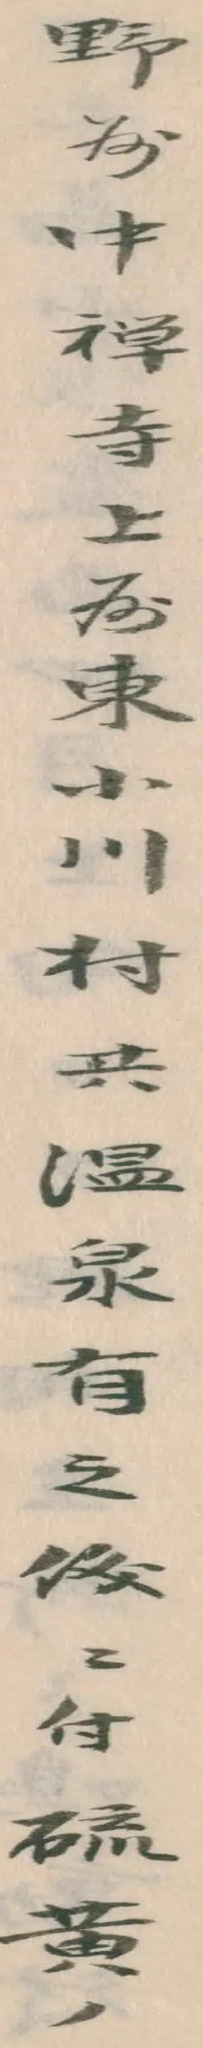野州中禅寺上州東小川村共温泉有之儀ニ付硫黄ノ
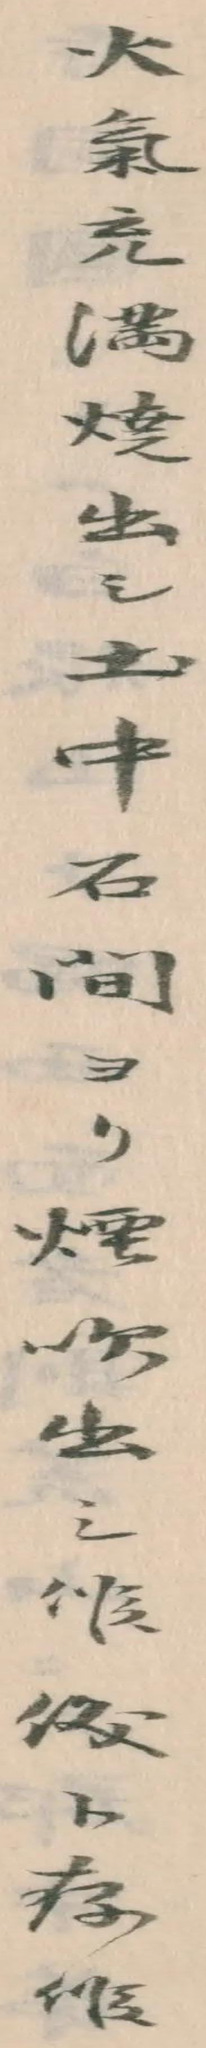火気充満焼出シ土中石間ヨリ煙吹出シ候儀ト存候
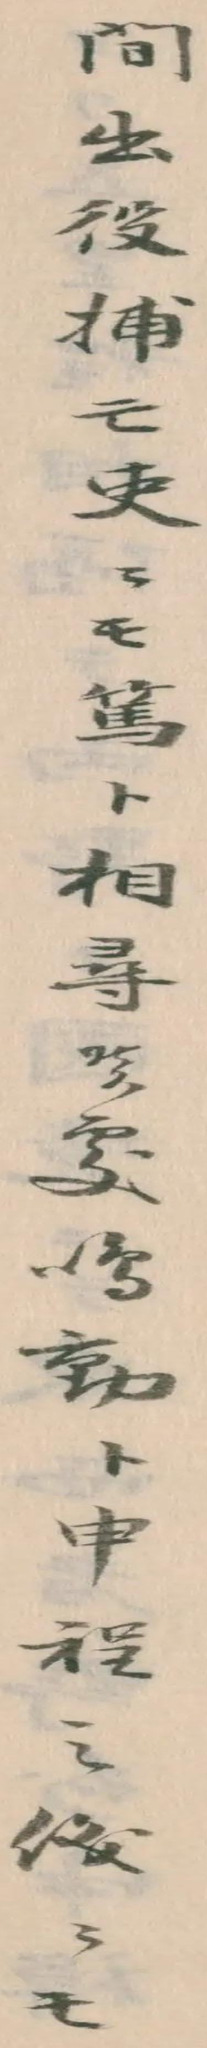間出役捕亡吏ニモ篤ト相尋候処鳴動ト申程之儀ニモ
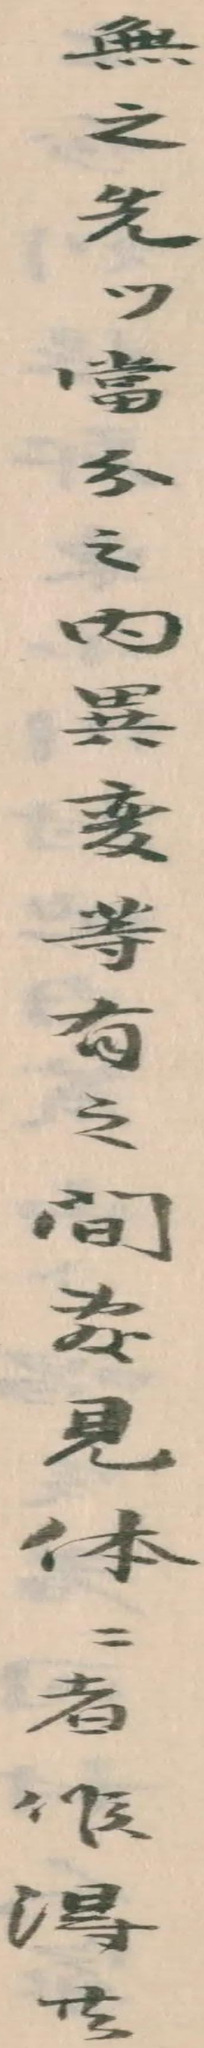無之先ツ当分之内異変等有之間敷見体ニ者候得共
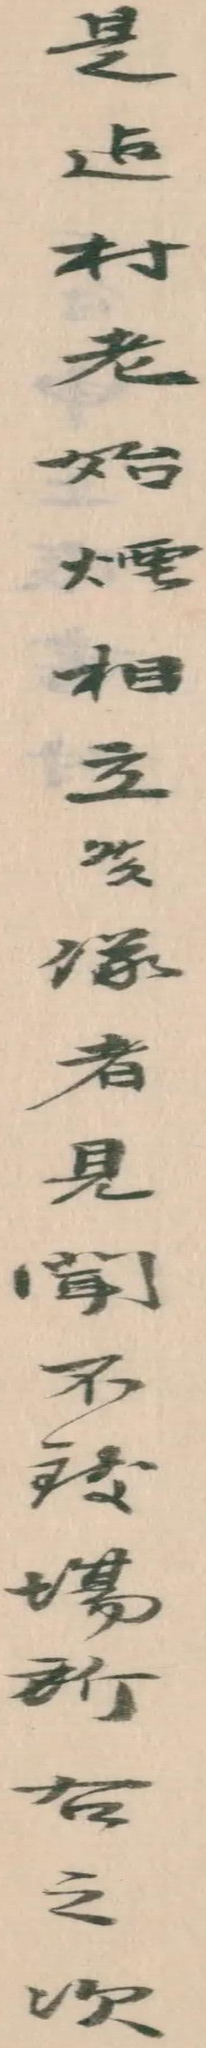是迄村老始煙相立候儀者見聞不致場所右之次
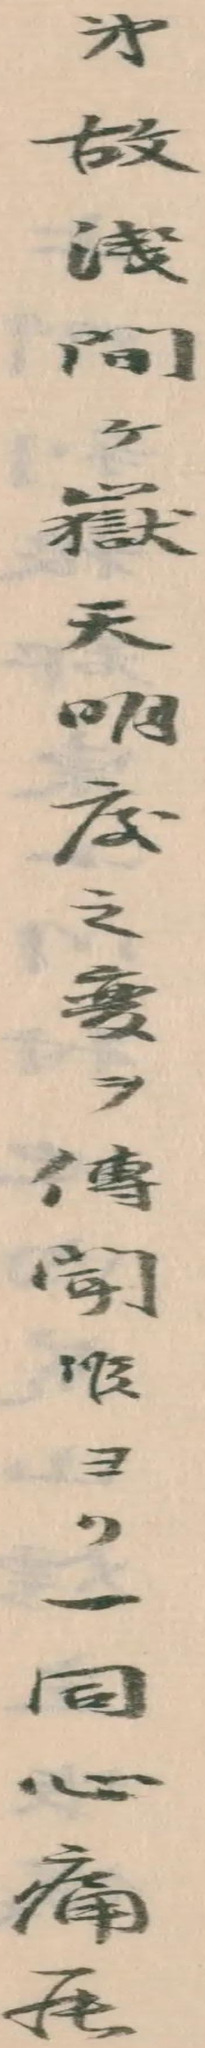第故浅間ケ嶽天明度之変ヲ伝聞候ヨリ一同心痛罷
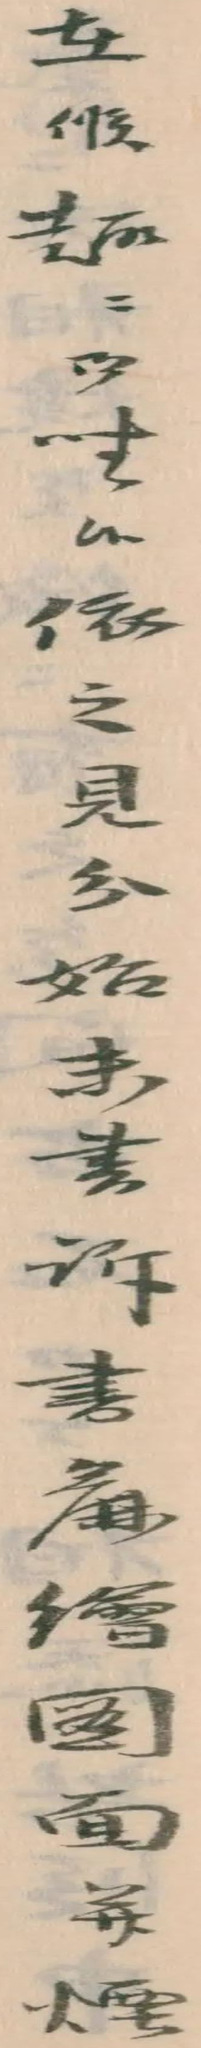在候趣ニ御坐候依之見聞始末書訴書麁絵図面并煙
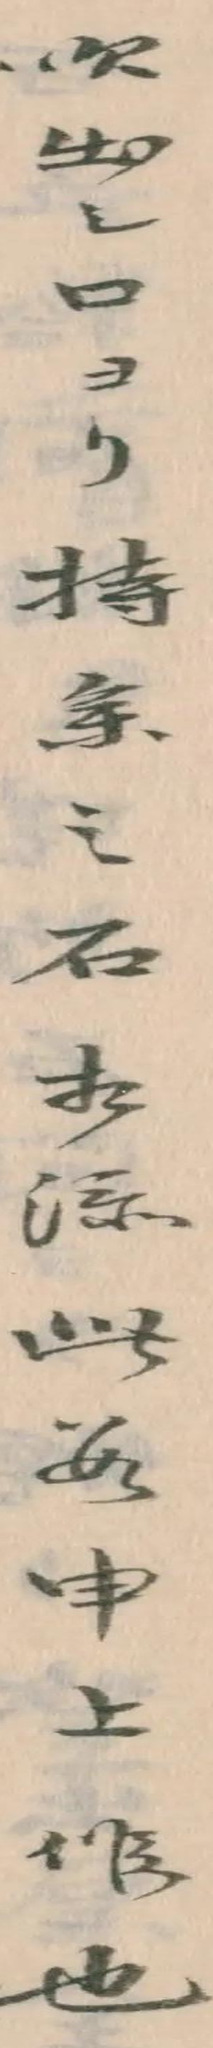吹出シ口ヨリ持参之石相添此段申上候也
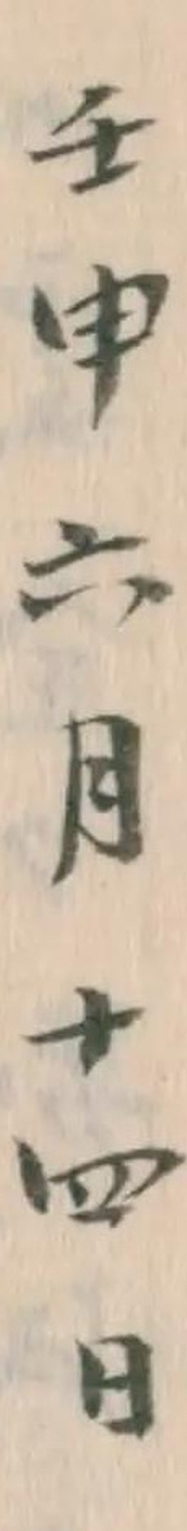壬申六月十四日
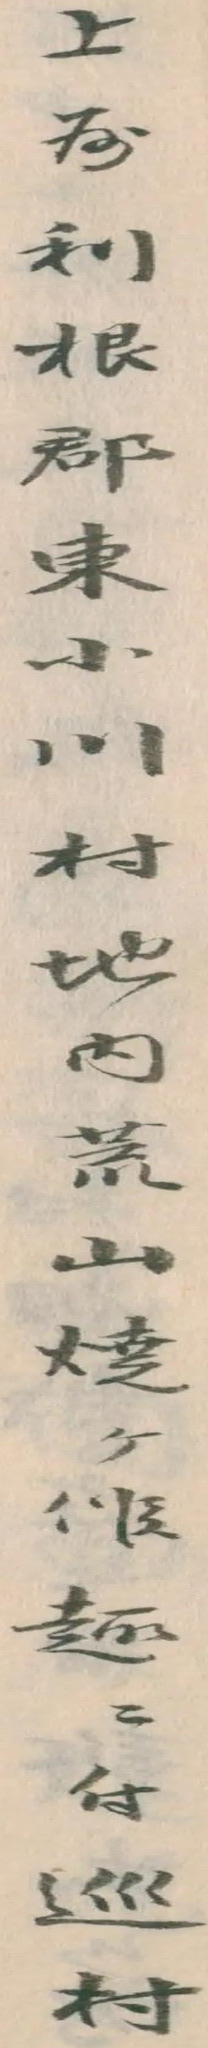上州利根郡東小川村地内荒山焼ケ候趣ニ付巡村
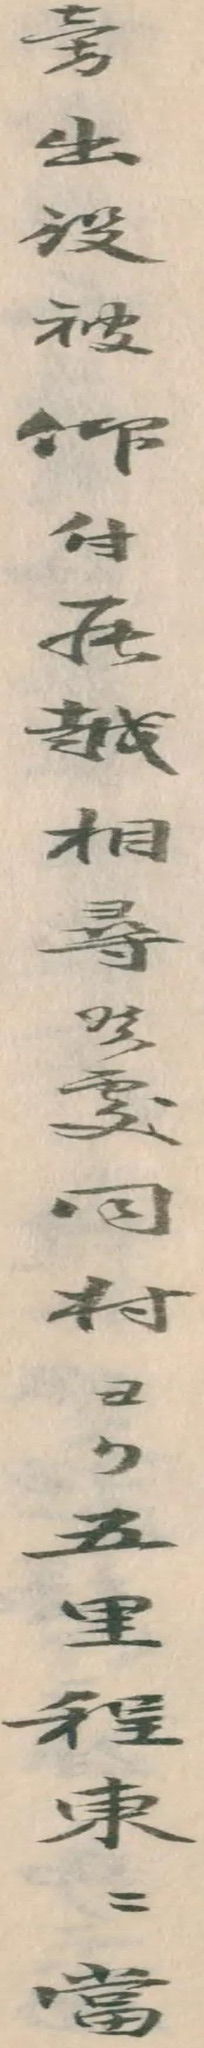旁出役被仰付罷越相尋候処同村ヨリ五里程東ニ当
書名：地災撮要. 巻11-12(地震之部)
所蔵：国立国会図書館 National Diet Library, JAPAN
